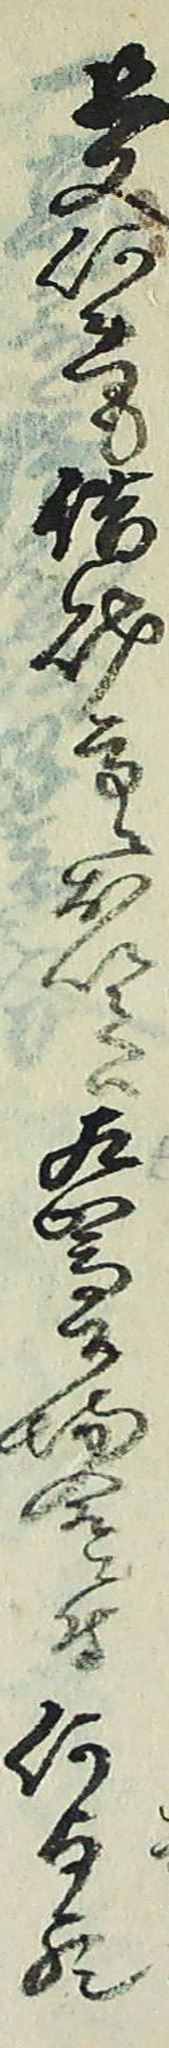且又何れも借財方ニおいてハ相嵩候場合ニ付何と欤
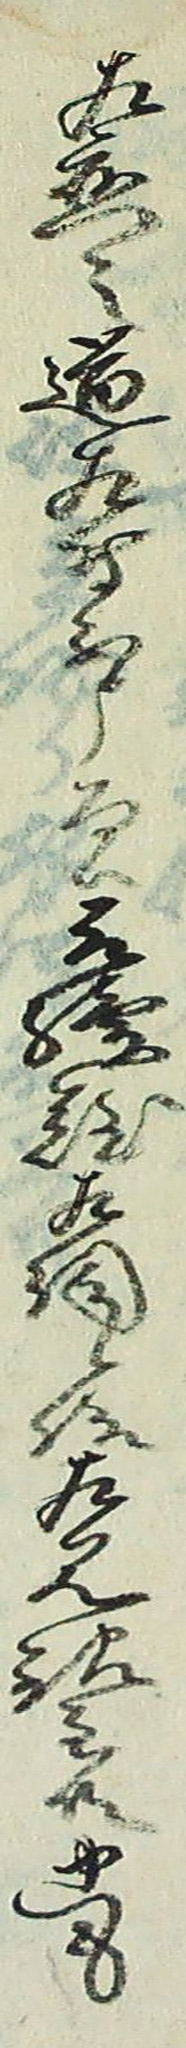相應之道相付不申而ハ取續難相調候様相見候銀主共迚も
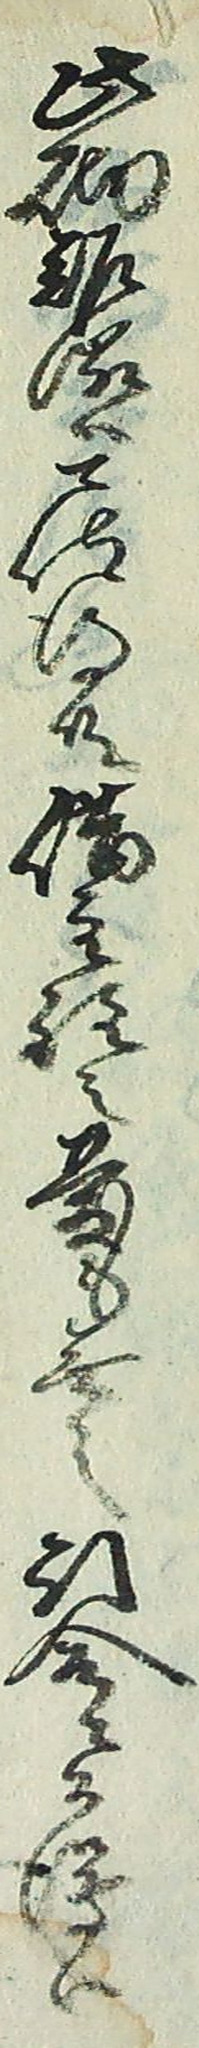此砌難渋ハ可仕候得共借主程之慶も無之引合ニ候得者
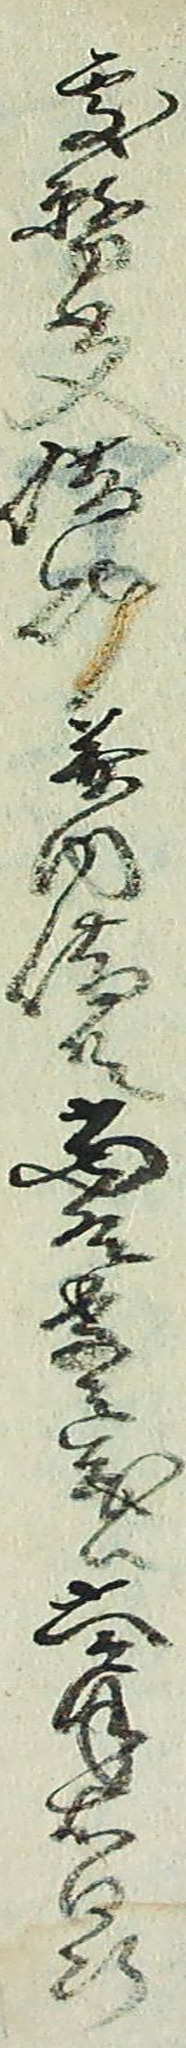處務書入借財幷内借共當冬季之義者六ケ月右同断
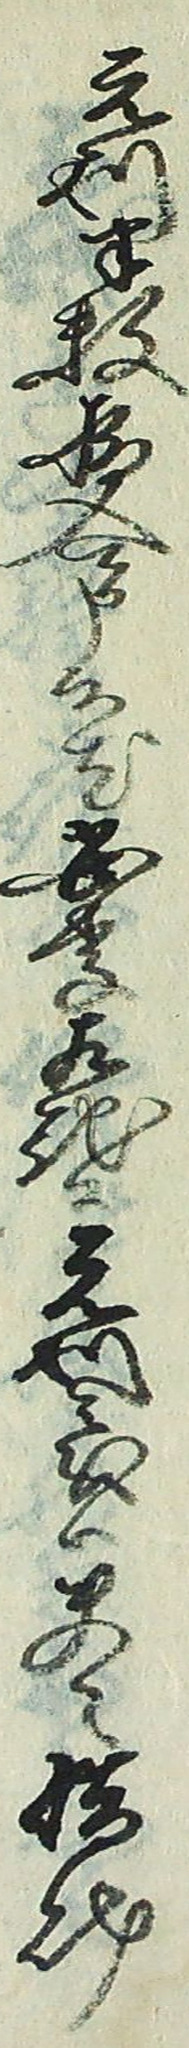元利半数指入可申候尤當季相馳候元利之義者夫々借財
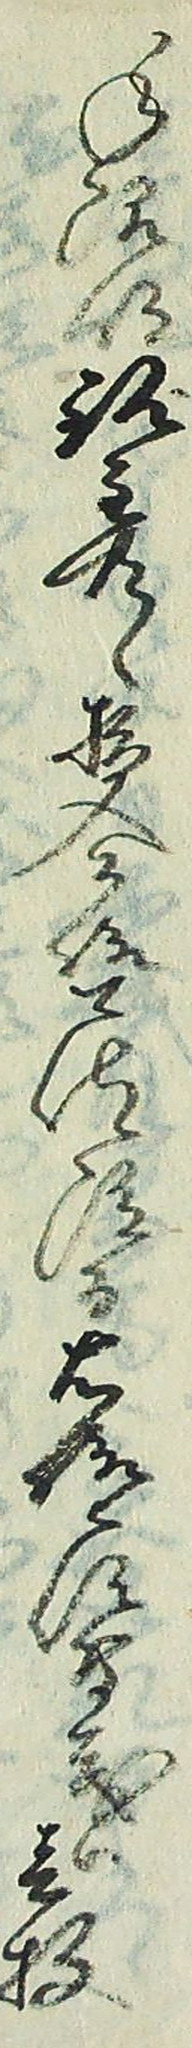年限明銀主共へ指入候様可仕候随而右様被仰付候義ハ壱牧
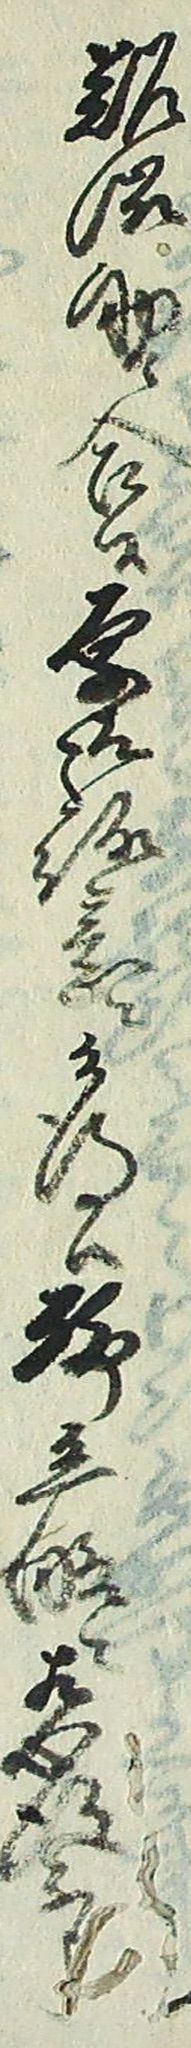難渋助ケ合候厚御趣意ニ候得ハ聊麁略ニ相心得不申
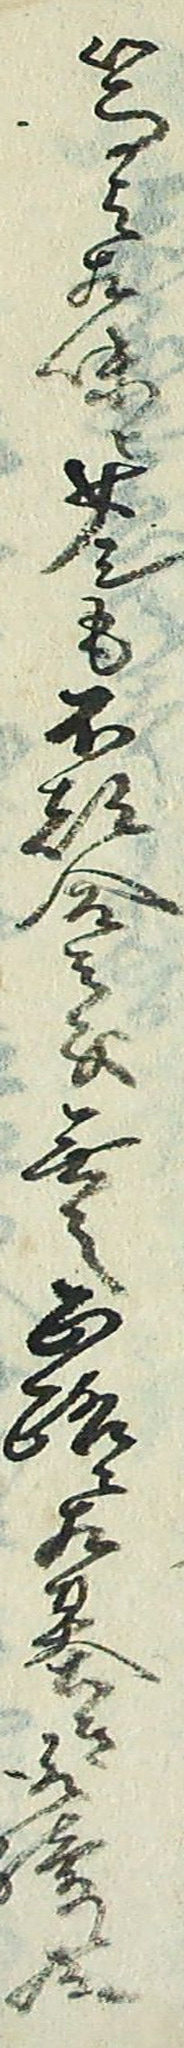篤と相味ヒ少シも不都合之義無之正路ニ相基き取續候様
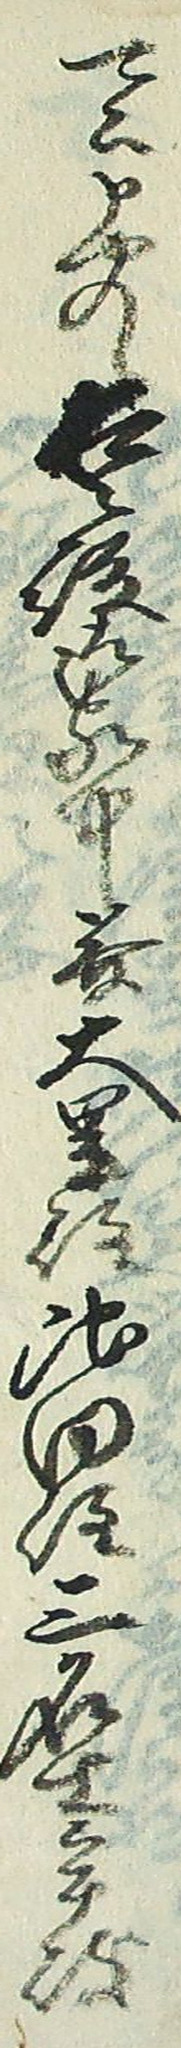可被申聞候右之趣御家中幷大里住池田住三名士牟岐

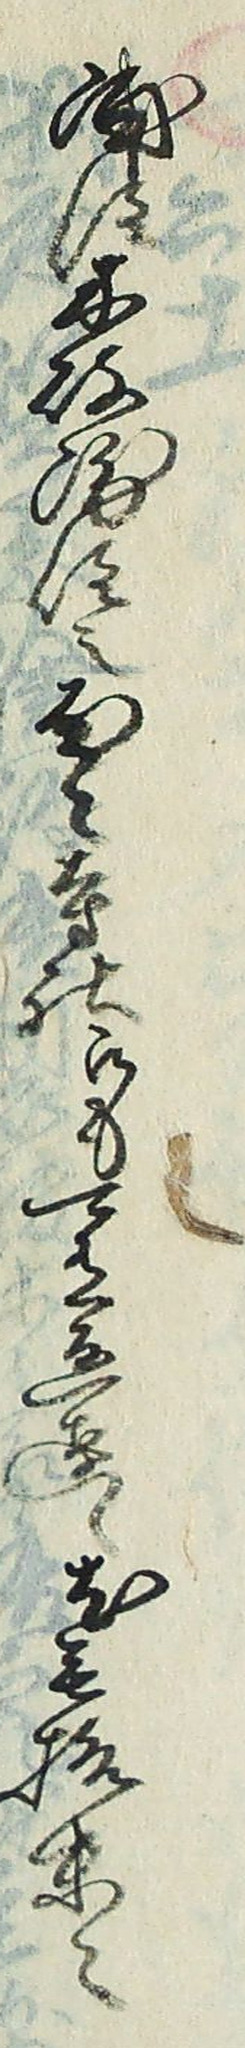浦住木岐浦住之面々寺社江も可有通達候尤無格末々
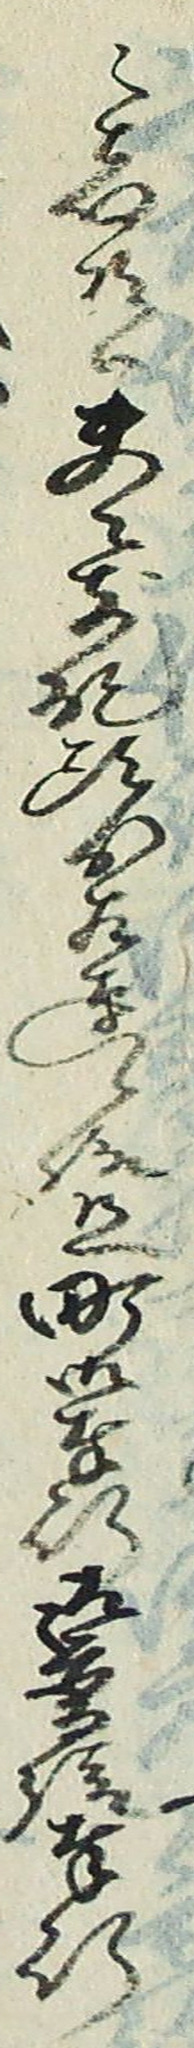之者共ハ夫々支配頭ゟ相達候様且町御奉行御普請奉行
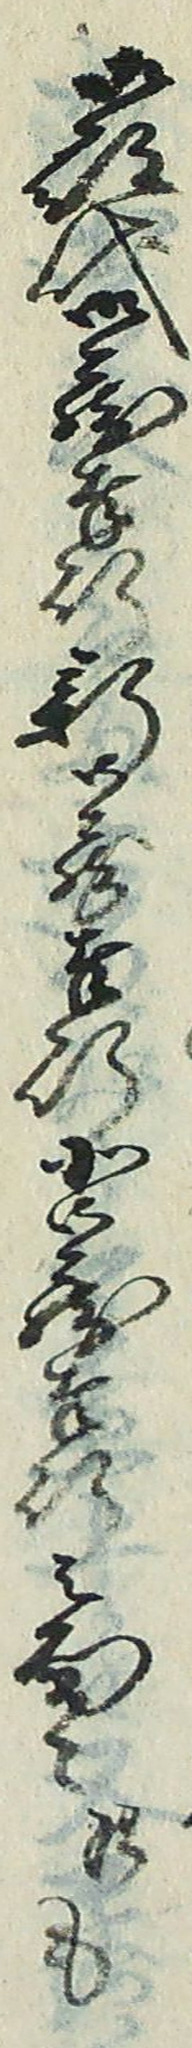御郡代御蔵奉行新御蔵奉行北御蔵奉行之面々江も
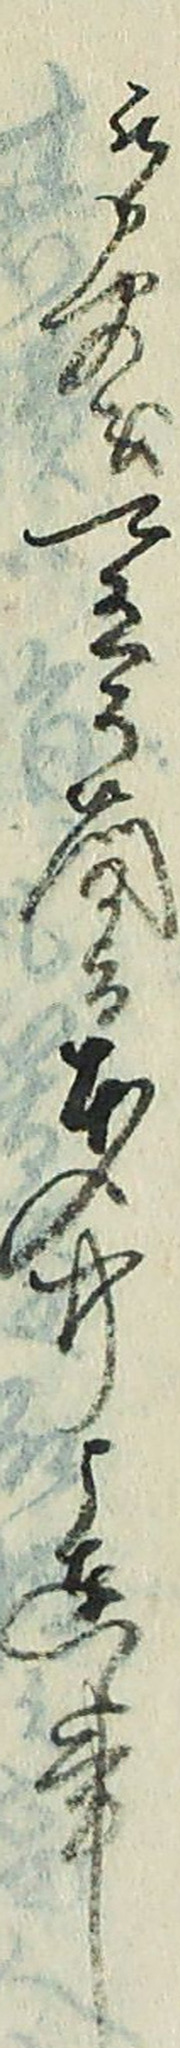被申聞義可有了簡旨本〆中申達候事
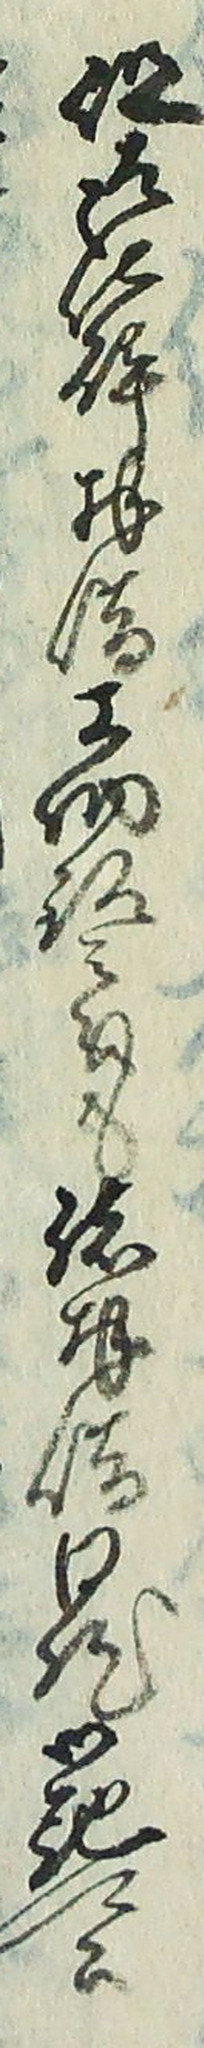但御仕解拝借上納銀之義も諸拝借同然御馳可被
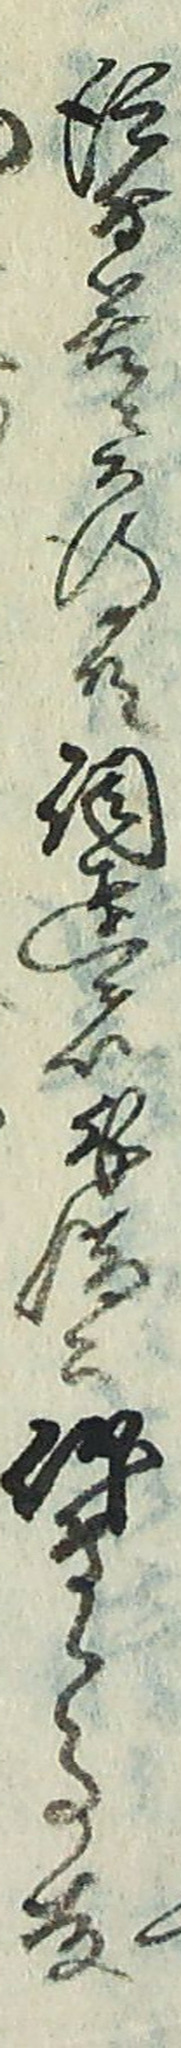仰付筈ニ候得共調達ヲ以拝借被仰付事故
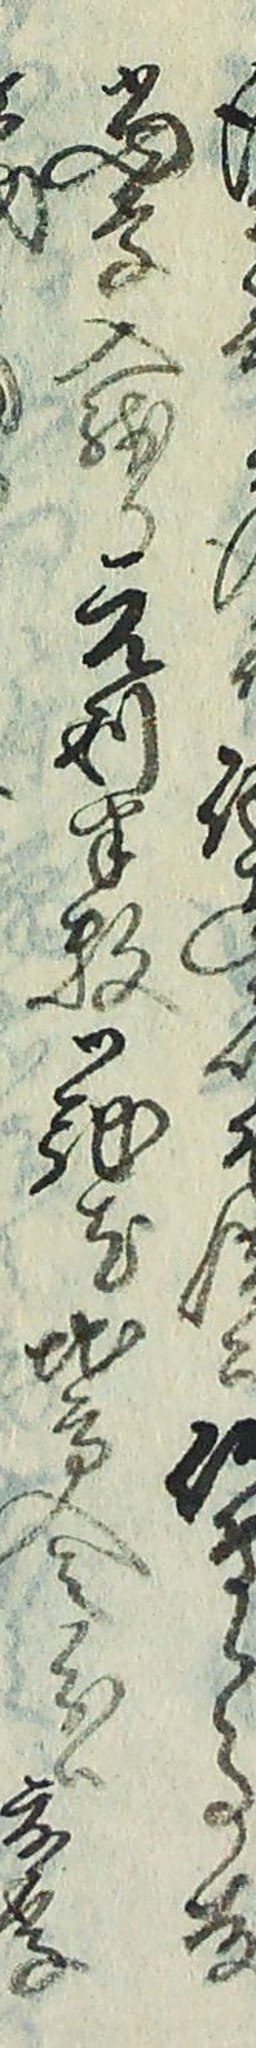當季入残り元利半数御馳尤地方入之分ハ夏季
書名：諸御趣意書并御下知向之写
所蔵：鳴門教育大学 Naruto University of Education
